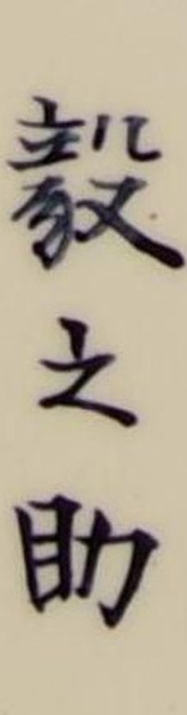穀之助
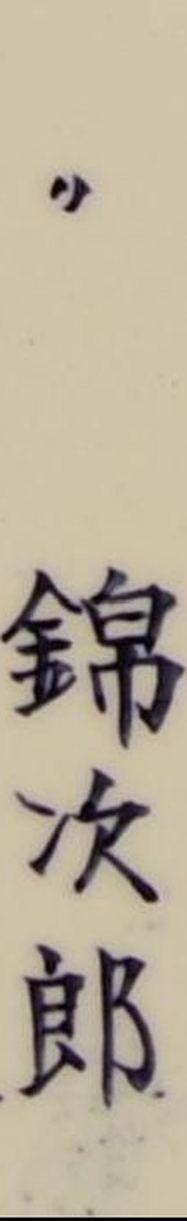錦次郎
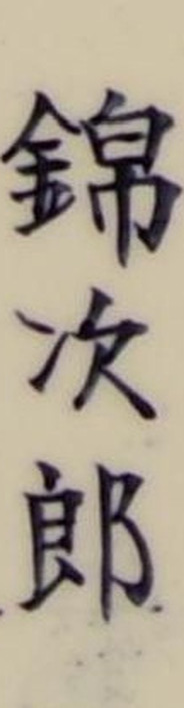錦次郎
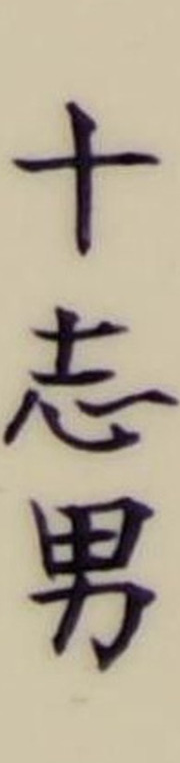十志男
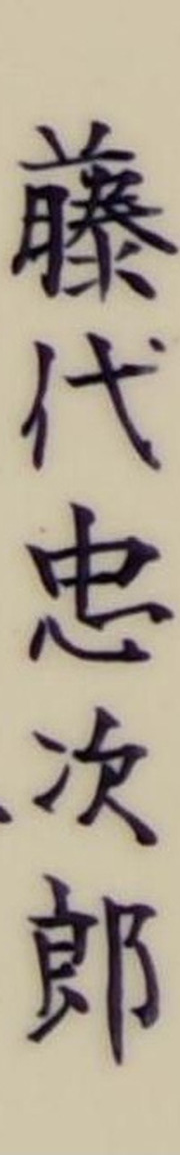藤代忠次郎

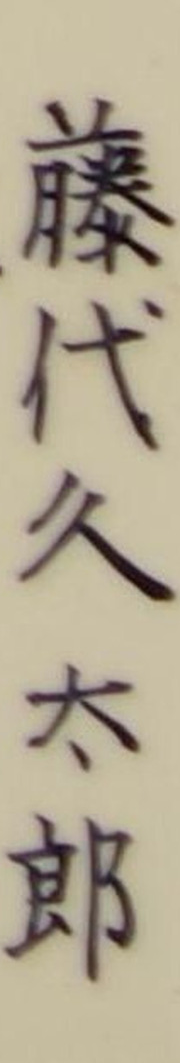藤代久太郎
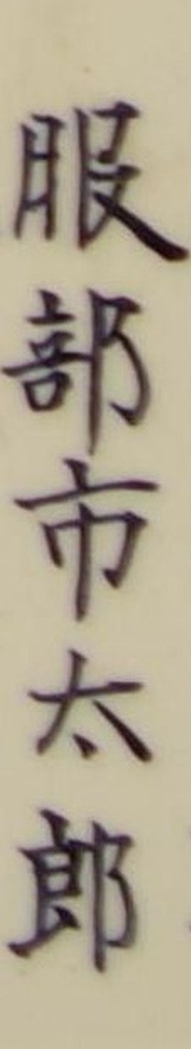服部市太郎
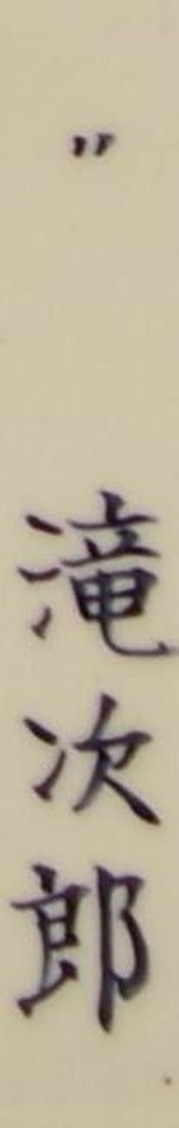滝次郎
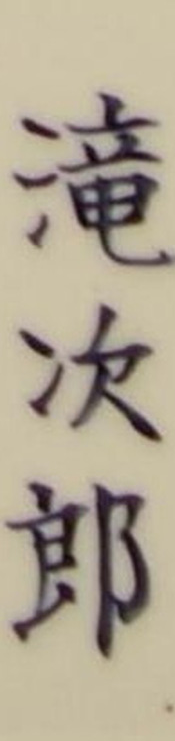滝次郎
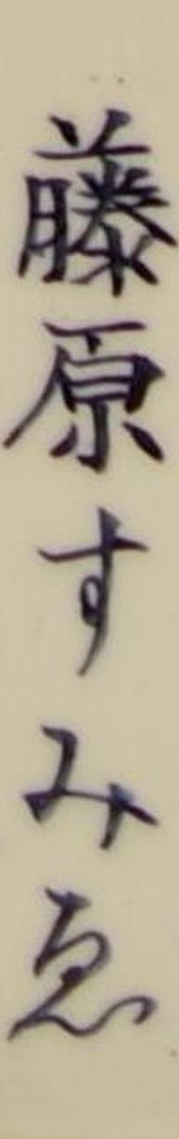藤原すみゑ
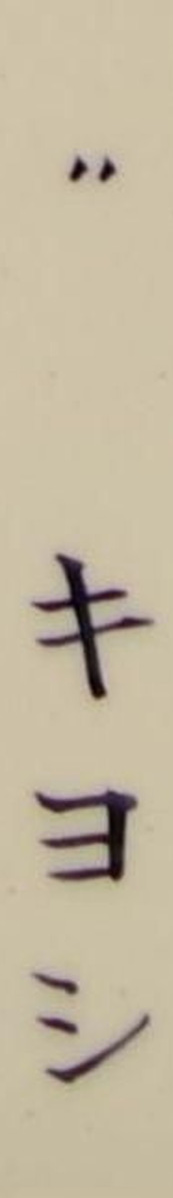キヨシ
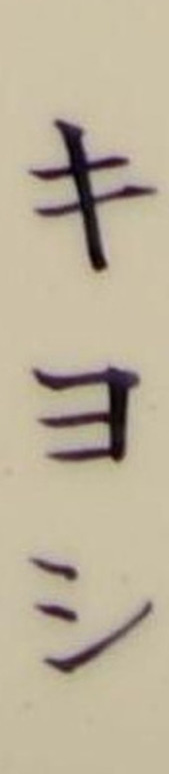キヨシ
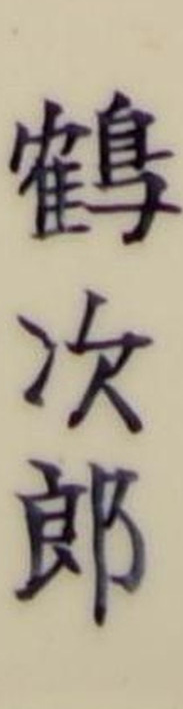鶴次郎

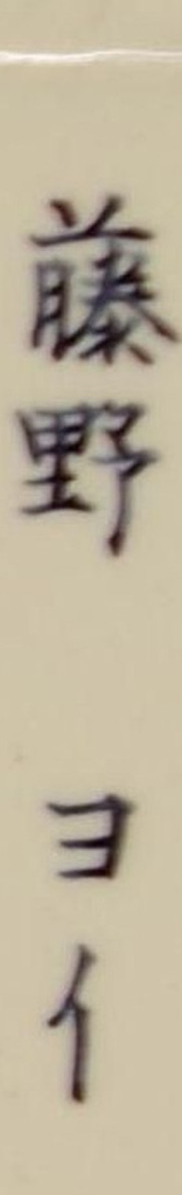藤野ヨイ
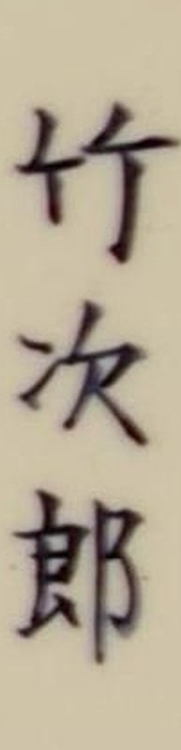竹次郎
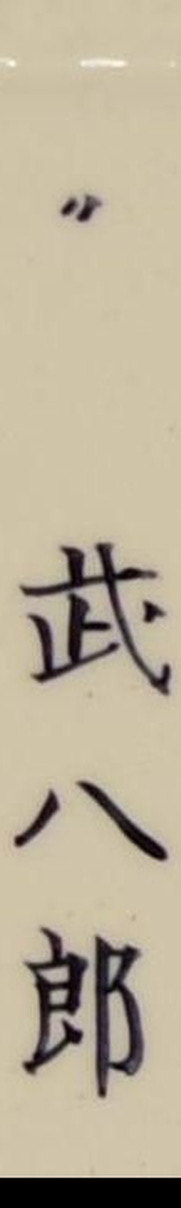武八郎
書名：E~L
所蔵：高野山金剛峯寺
